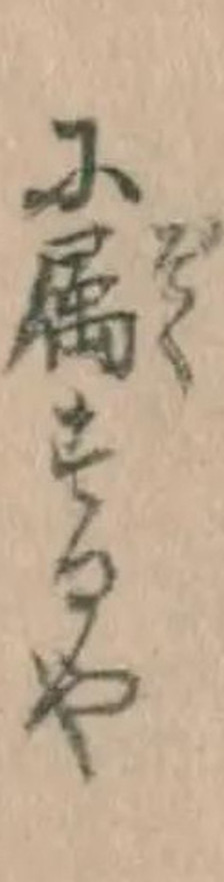に属するや
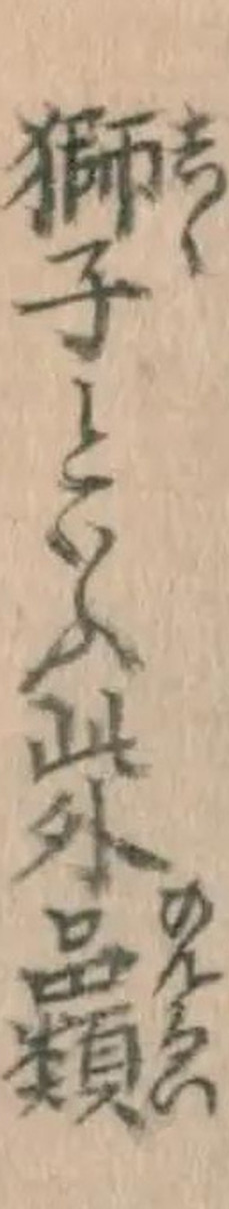獅子といふ此外品類
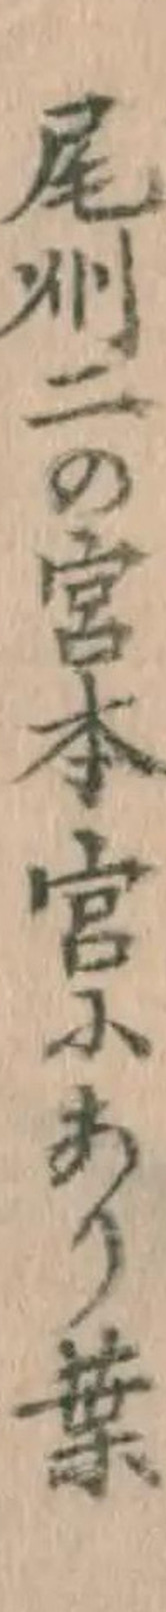尾州二の宮本宮にあり葉
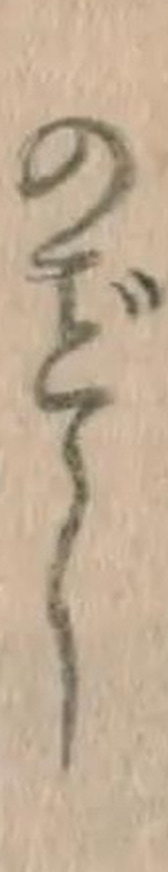のごとし
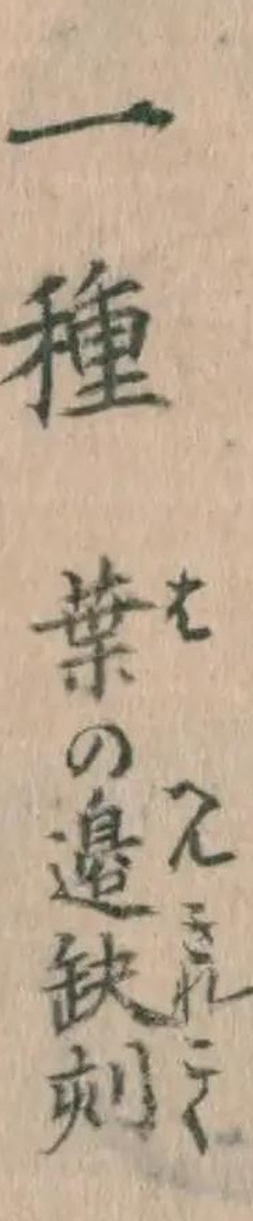一種葉の辺欠刻
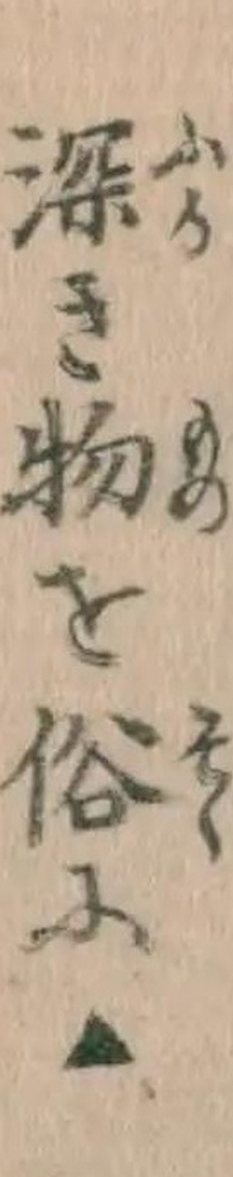深き物を俗に▲
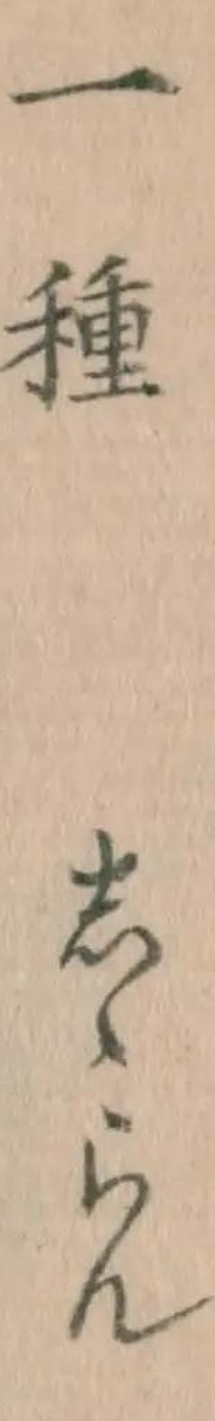一種しゝらん
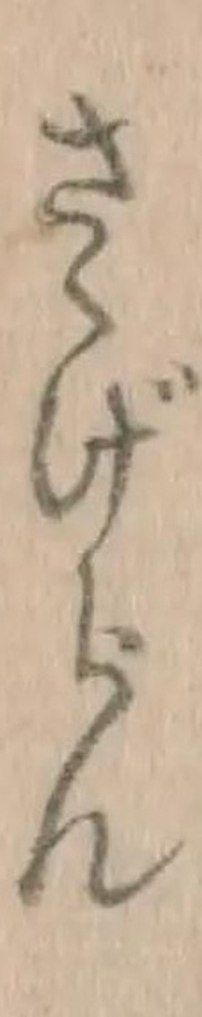さゝげらん
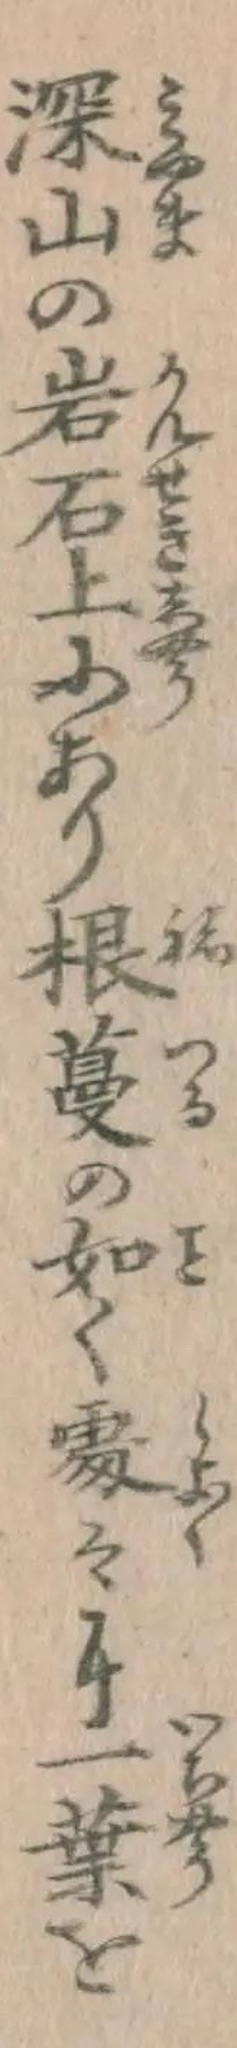深山の岩石上にあり根蔓の如く処々に一葉を

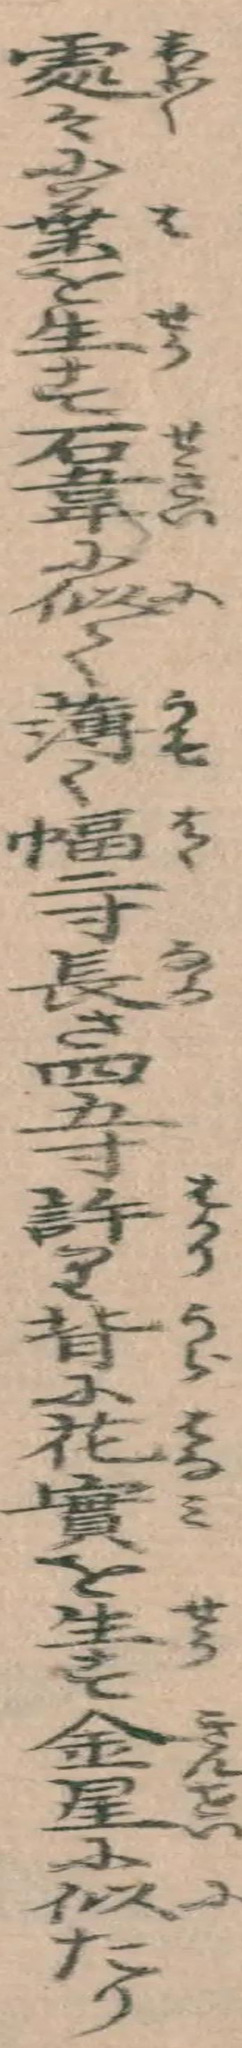処々に葉を生す石韋に似て薄く幅二寸長さ四五寸許り背に花実を生す金星に似たり
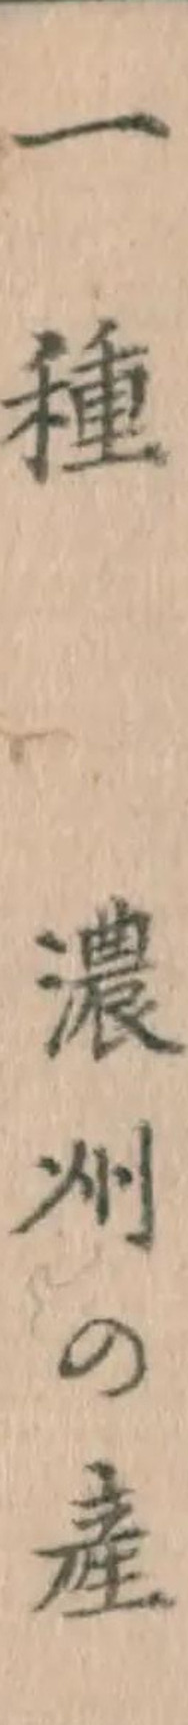一種濃州の産
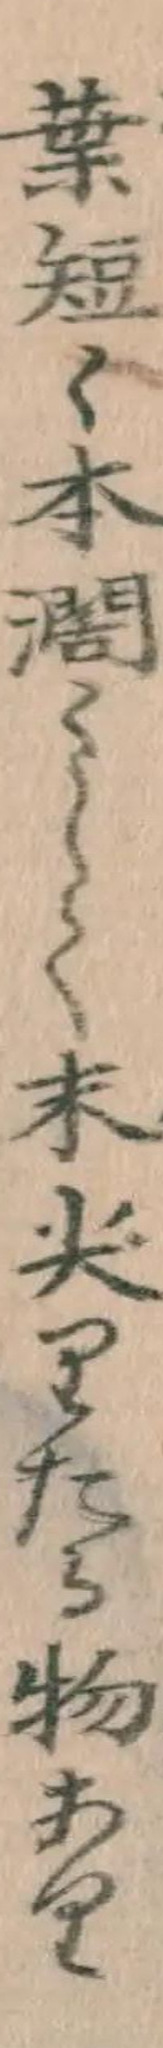葉短く本闊くして末尖りたる物あり
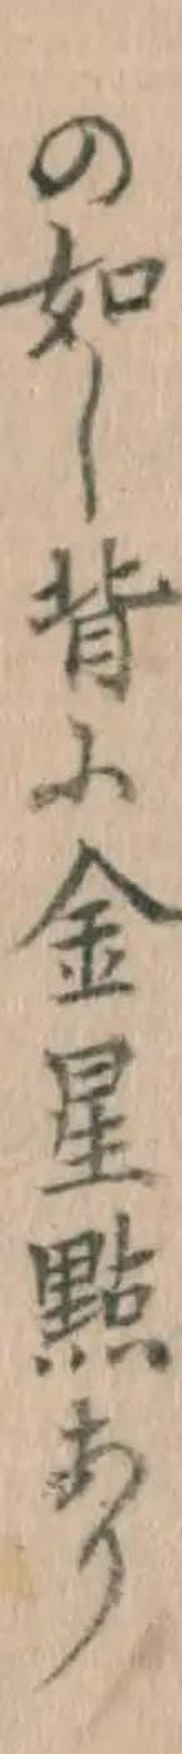の如し背に金星点あり
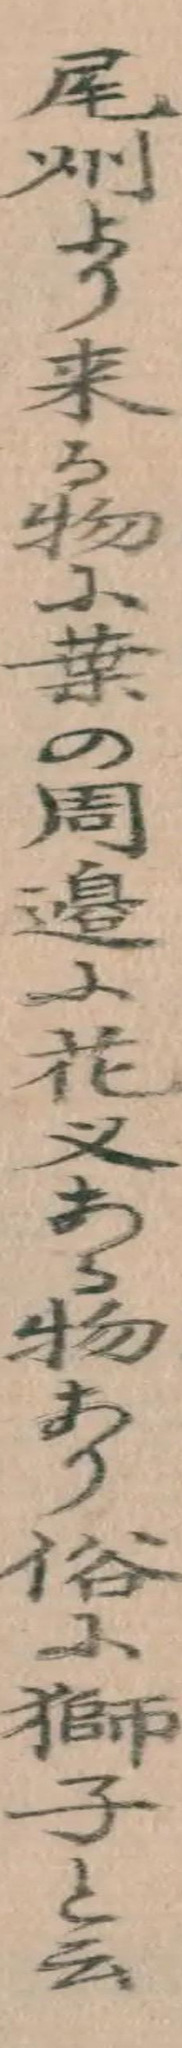尾州より来る物に葉の周辺に花叉ある物あり俗に獅子と云
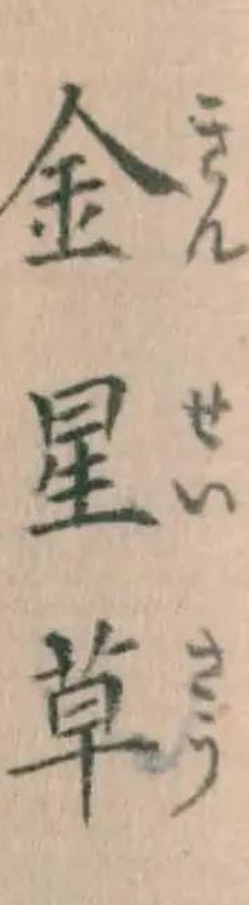金星草
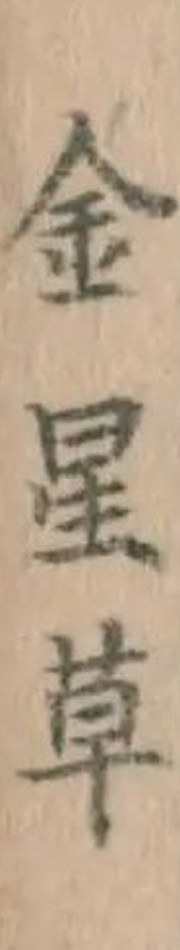金星草
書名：本草図譜. 巻34-36
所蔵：国立国会図書館 National Diet Library, JAPAN
